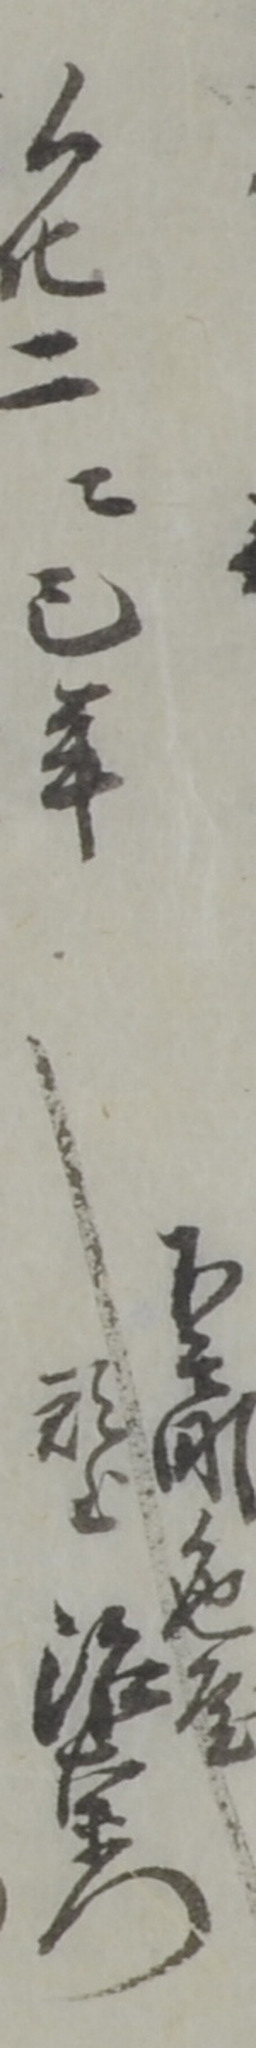弘化二乙巳年願主治右衛門
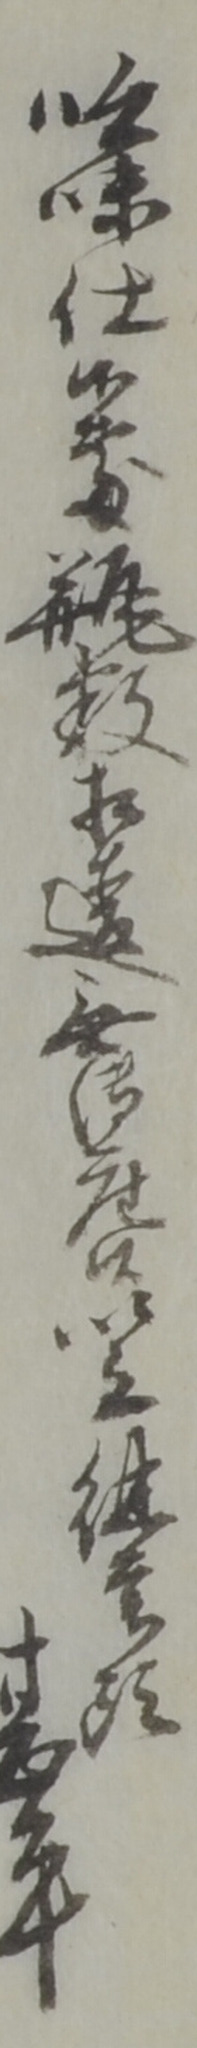吟味仕候處瓶数相違無御座候以上紺屋頭
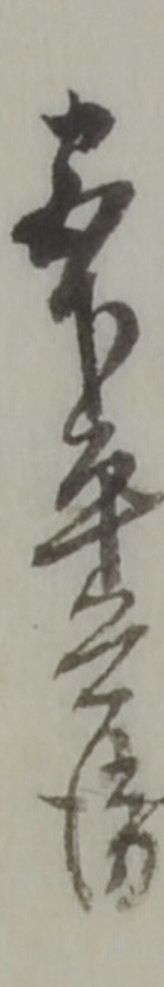宮下平兵衛
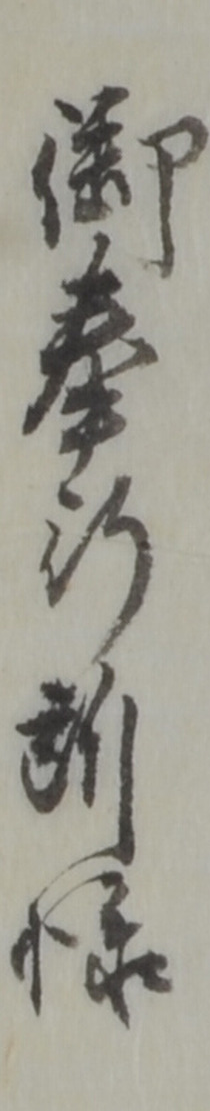御奉行所様
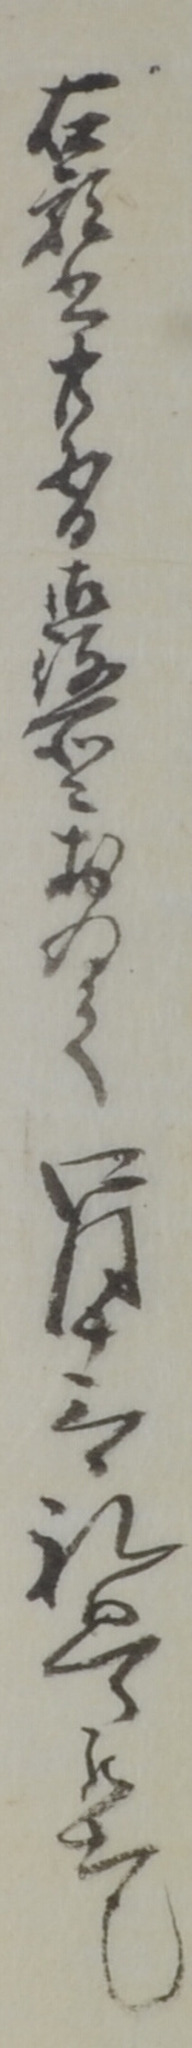右願書廿五日御役所ニおゐて四月十三日礼是罷出申候
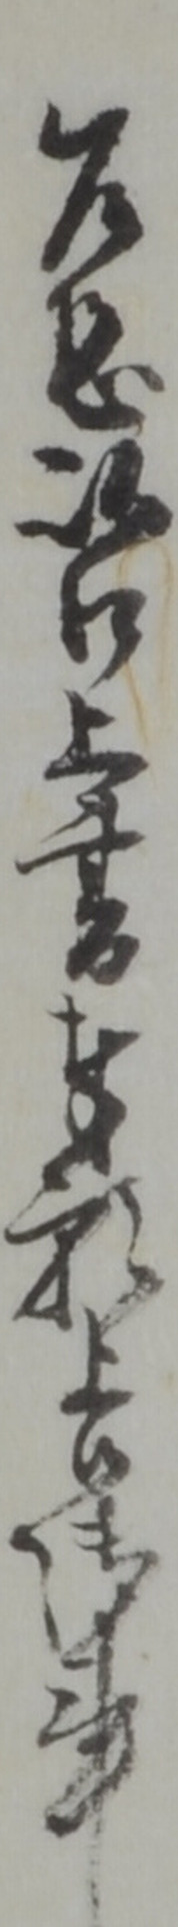乍恐以口上書奉願上候御事
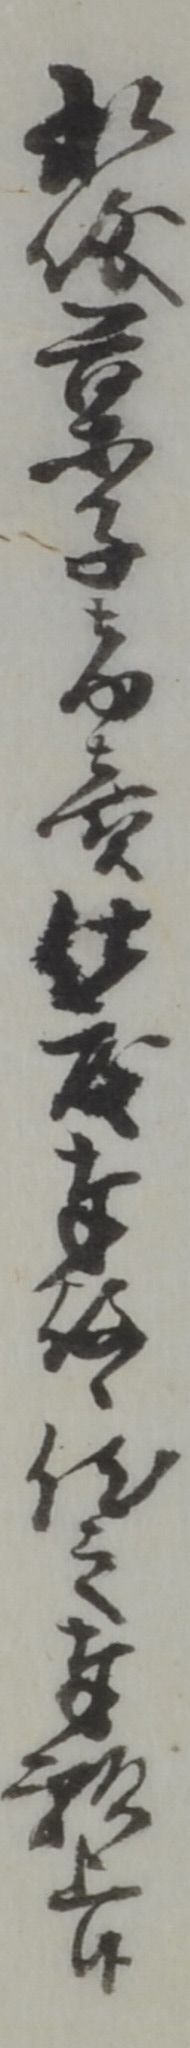私儀菓子商売仕度奉存候依之奉願上候
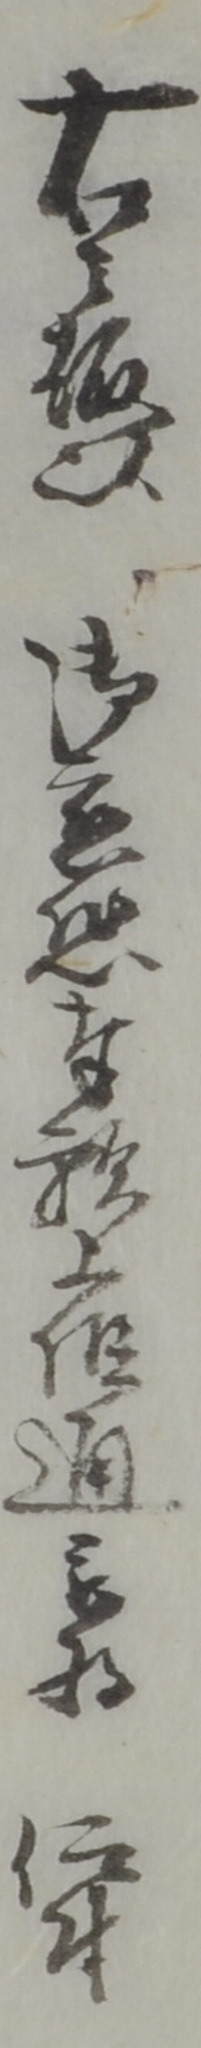右之趣以御慈悲奉願上候通被為仰付
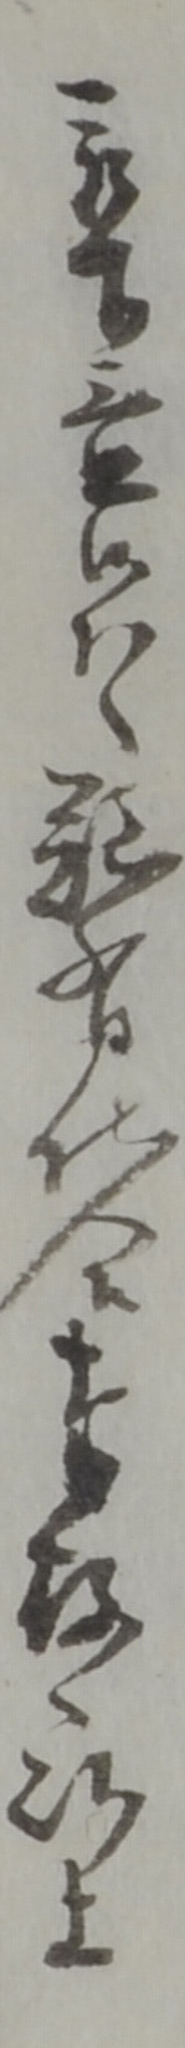被下置候ハヽ難有仕合奉存候以上
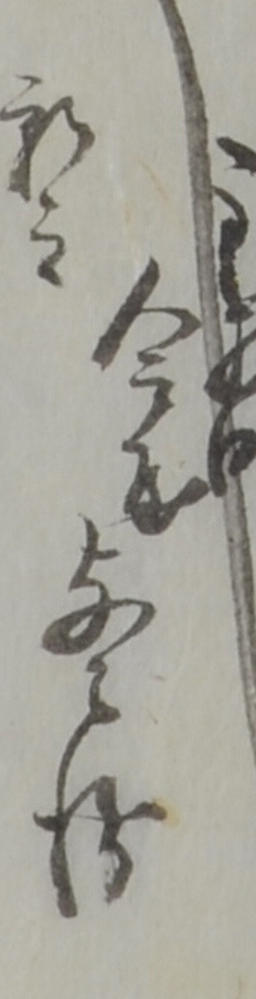願主与兵衛
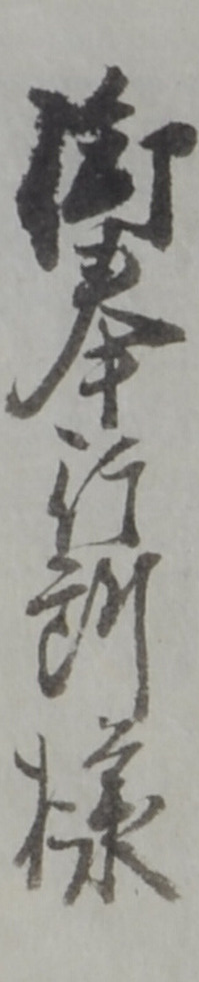御奉行所様
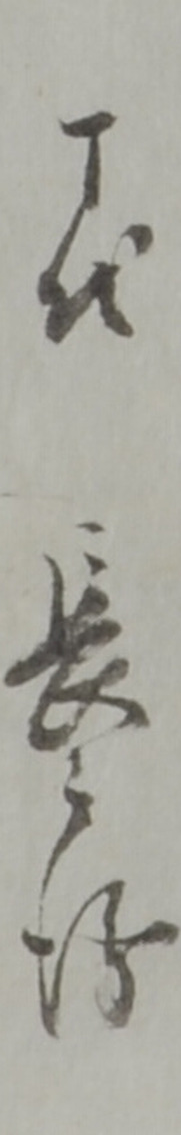丁代長兵衛
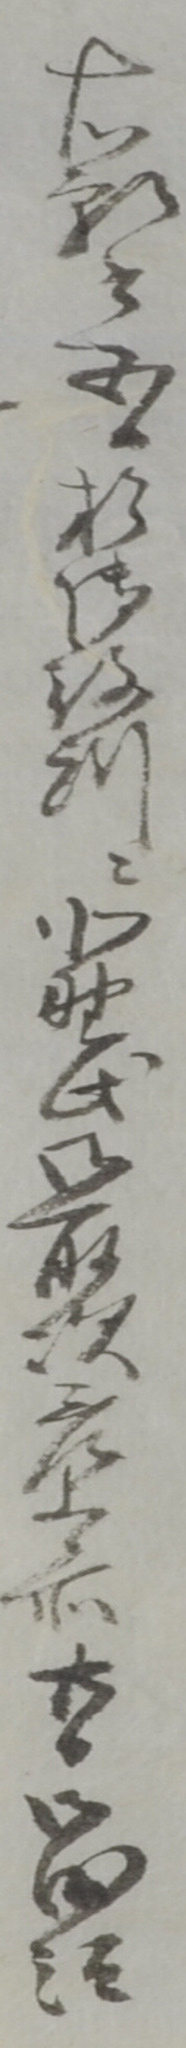右願書五日於御役所ニ北野氏御取次差上候所廿日御沙汰
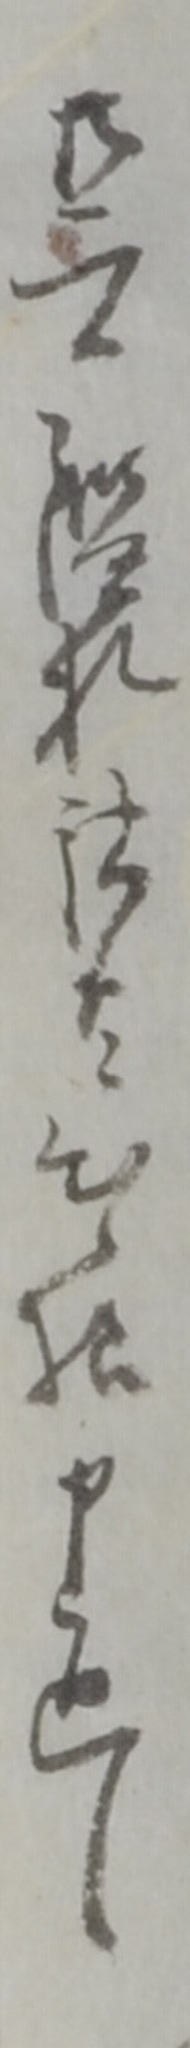廿二日鑑札請取出候様申通候

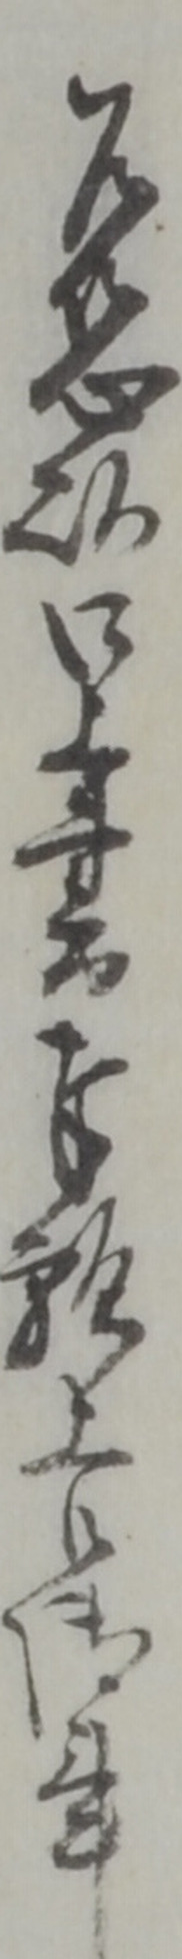乍恐以口上書奉願上候御事
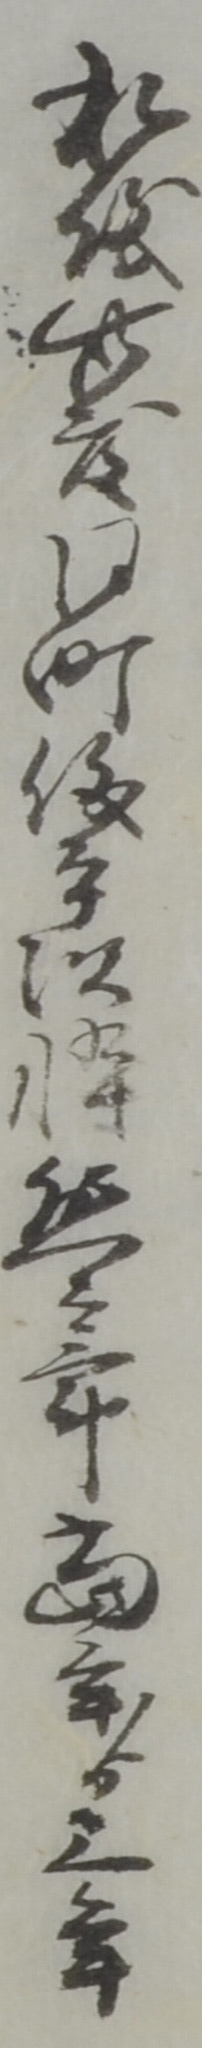私儀此度同町儀平次忰熊太郎当年ゟ三年
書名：諸願書控簿
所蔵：伊那市立高遠町図書館・合同会社AMANE
